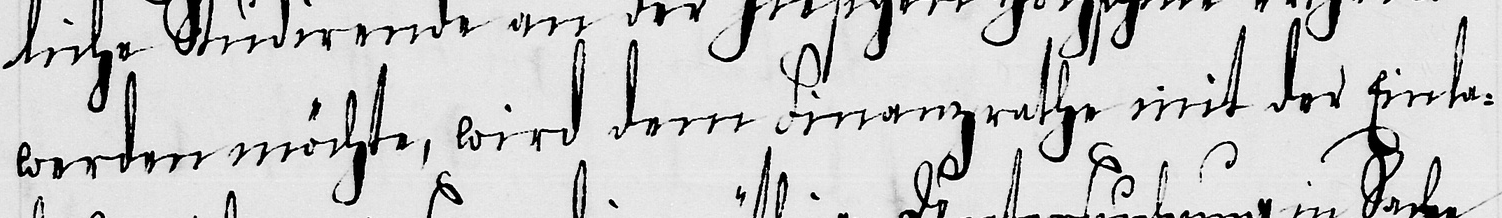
werden möchte, wird dem Finanzrathe mit der Einla¬
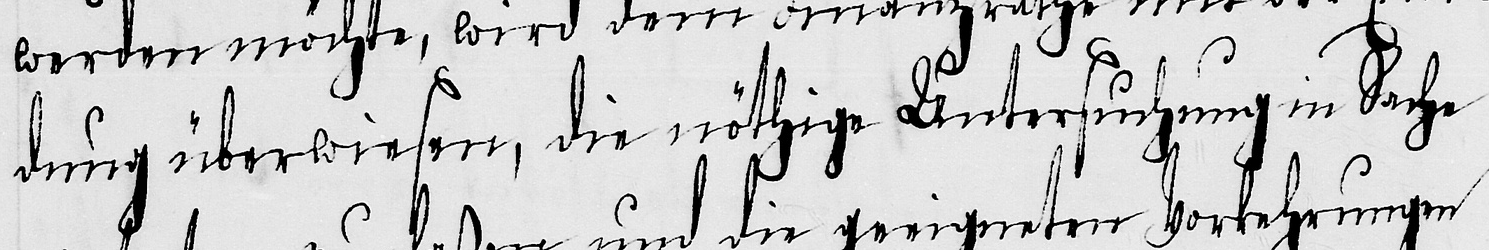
dung überwiesen, die nöthige Untersuchung in Sache
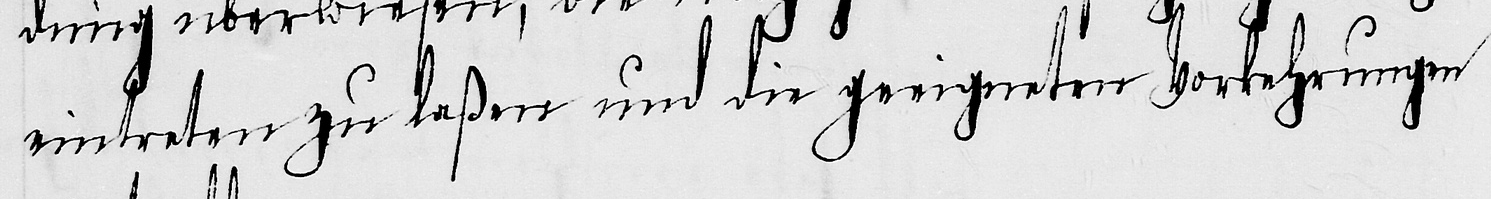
eintreten zu laßen und die geeigneten Vorkehrungen
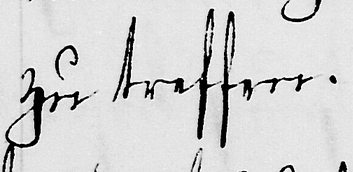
zu treffen.
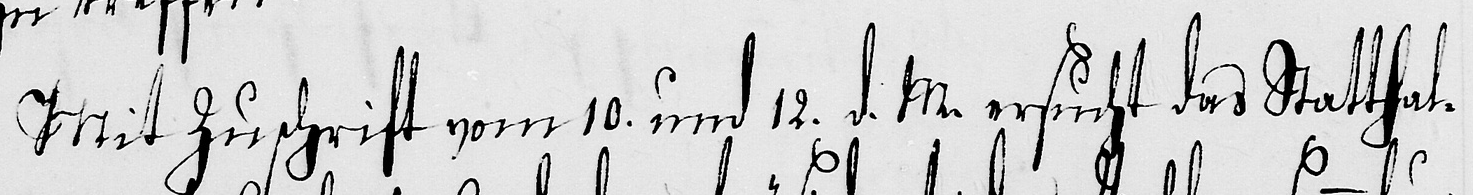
Mit Zuschrift vom 10. und 12. d. M. ersucht das Statthal¬
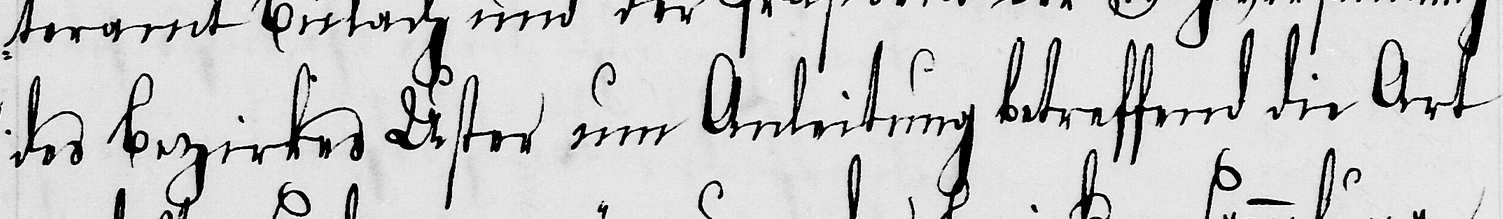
des Bezirkes Uster um Anleitung betreffend die Art
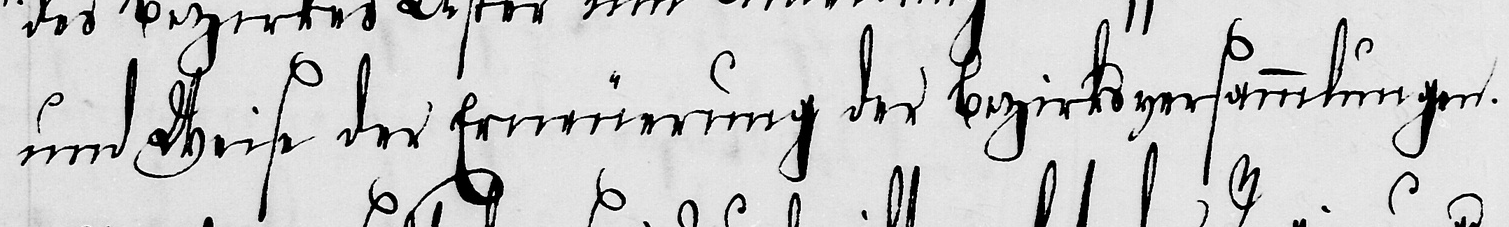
und Weise der Erneuerung der Bezirksversammlungen.
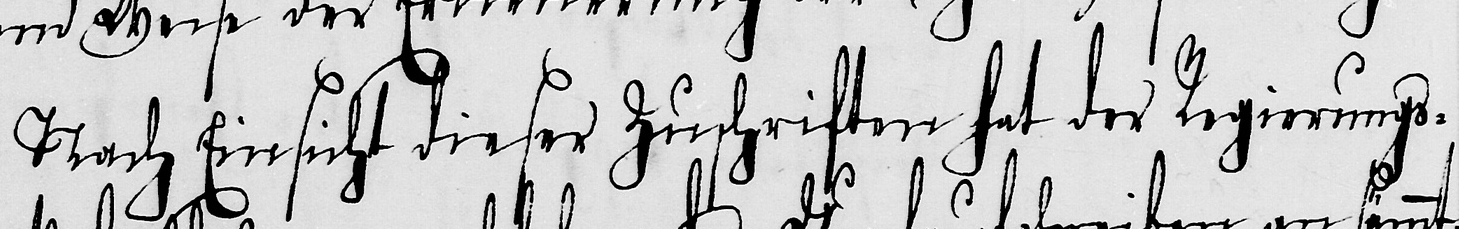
Nach Einsicht dieser Zuschriften hat der Regierungs¬
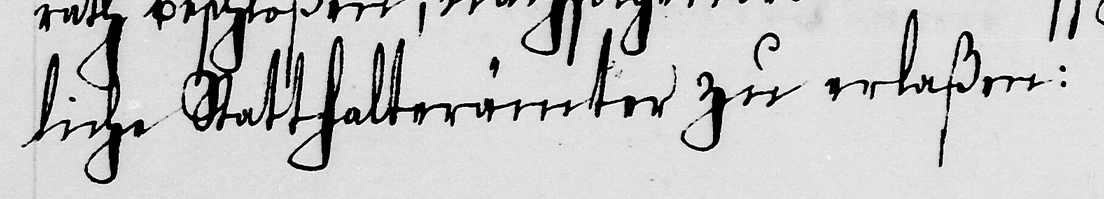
tliche Statthalterämter zu erlaßen:
